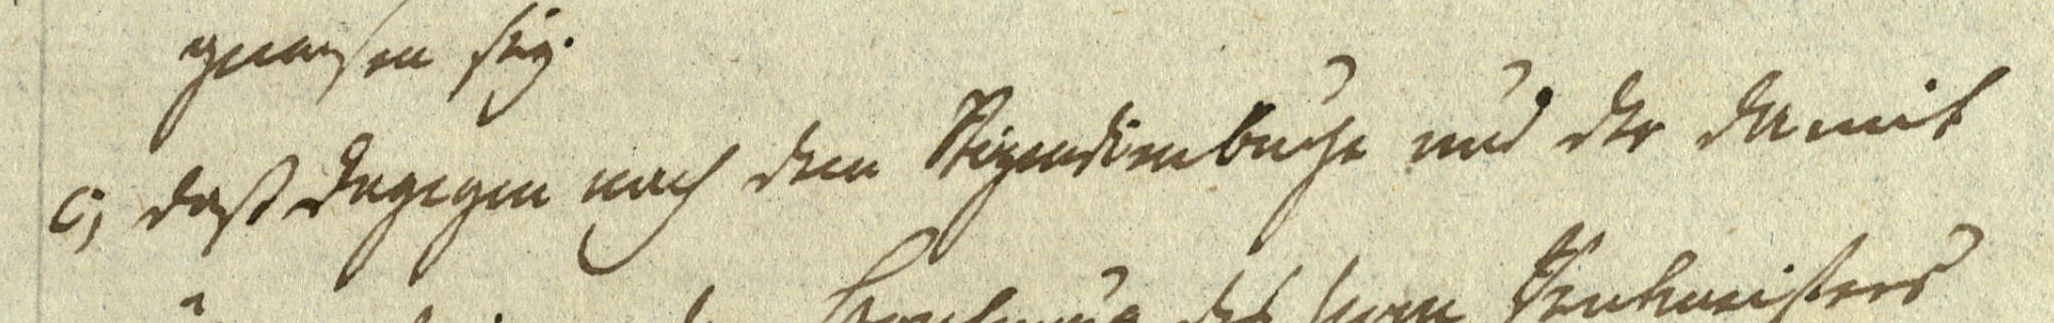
c, daß dagegen nach dem Stipendienbuche und der damit
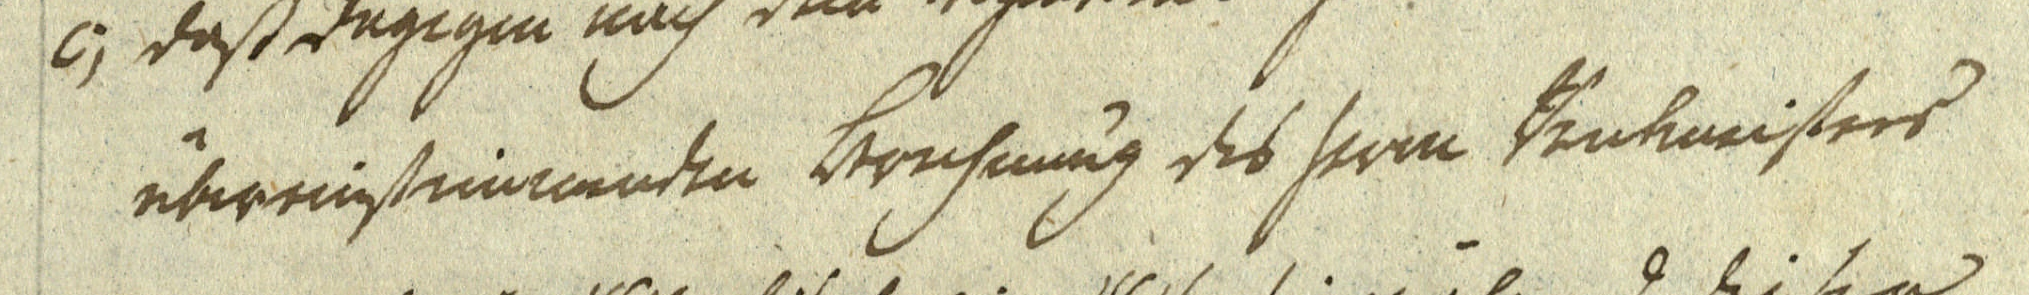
eübereinstimmenden Berechnung des Herrn Rentmeisters
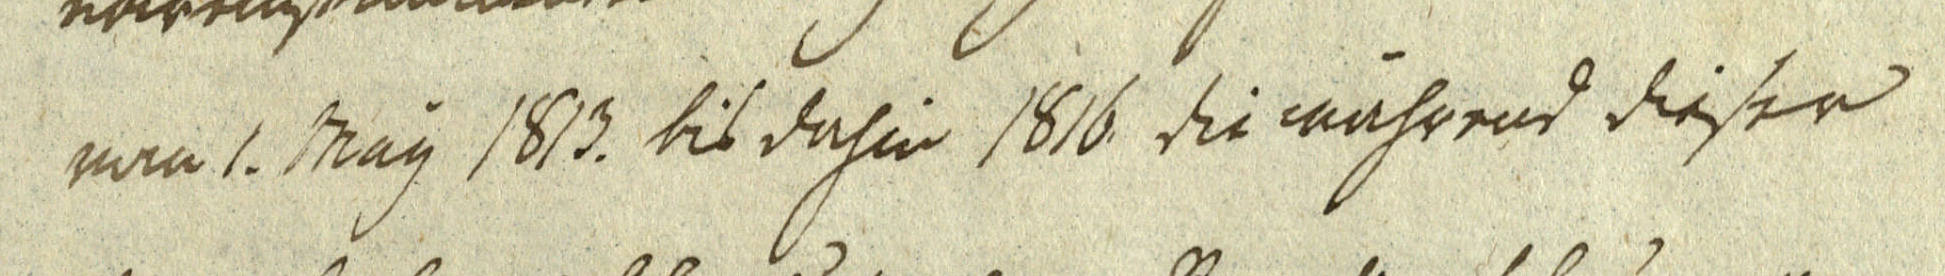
vom 1. Maÿ 1813. bis dahin 1816. die während dieser
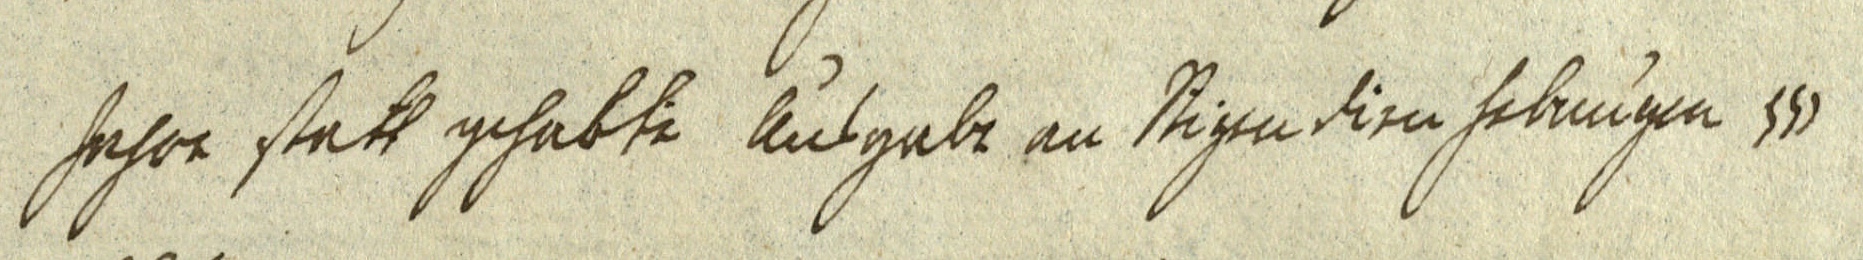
Jahre statt gehabte Ausgabe an Stipendien Hebungen
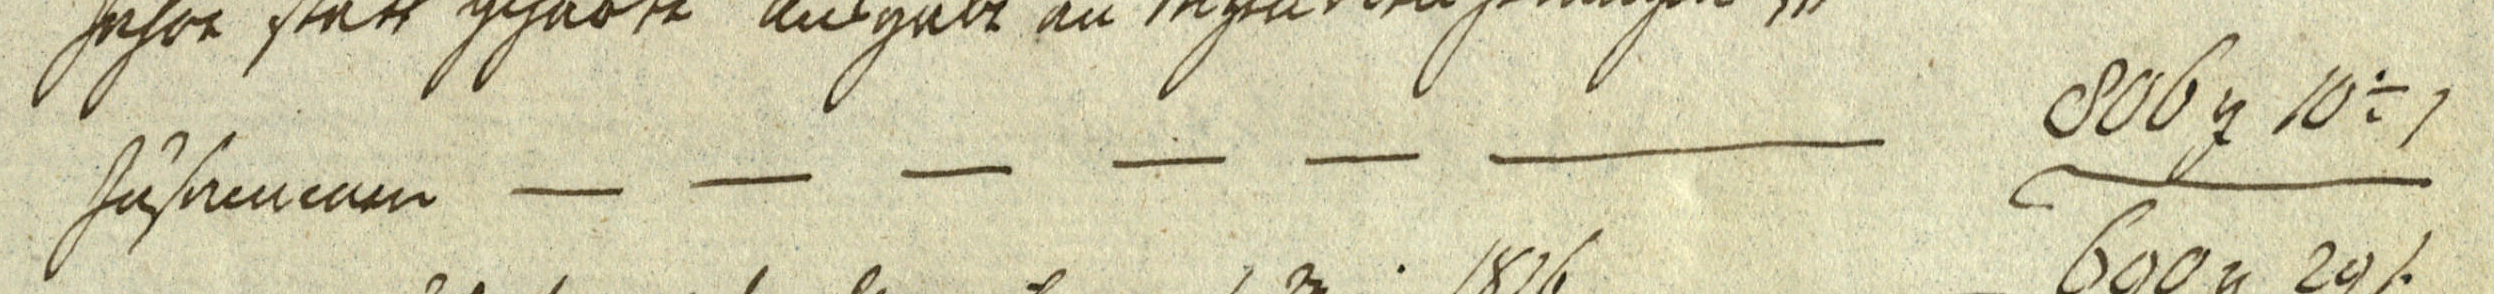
zusammen 806 rt 10
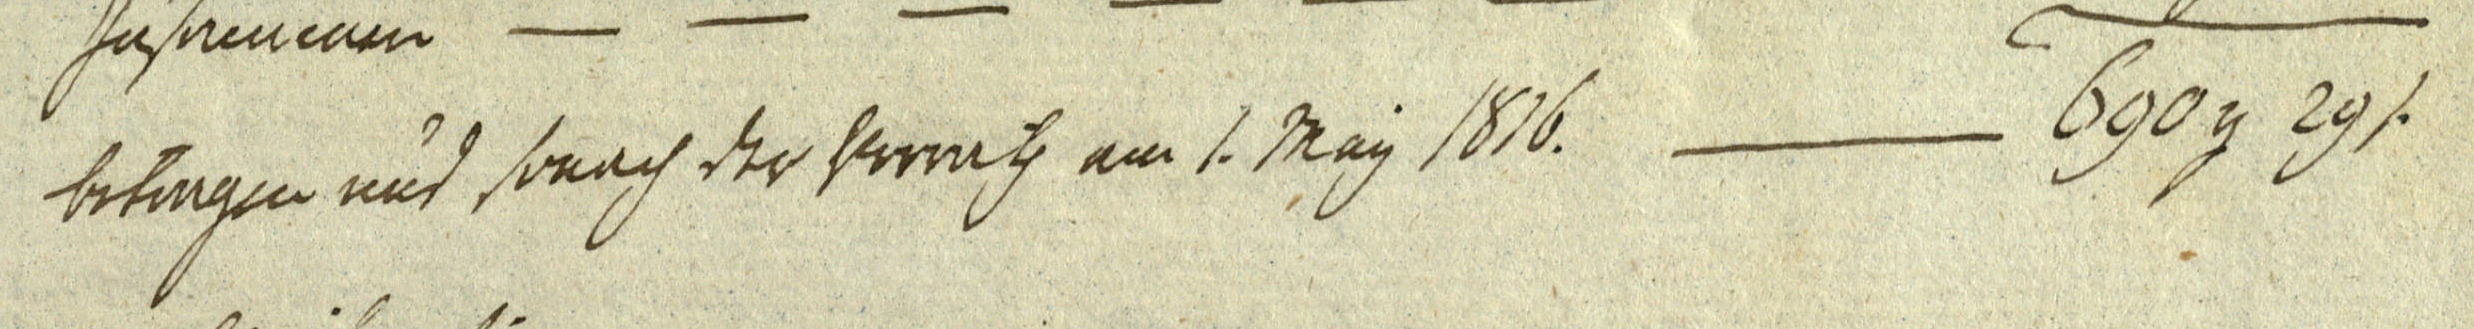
betragen und sonach der Vorrath an 1. Maÿ 1816. 690 rt 29 s.
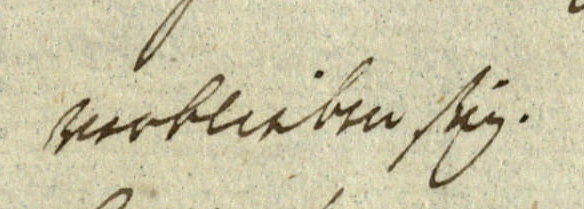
verblieben seÿ.
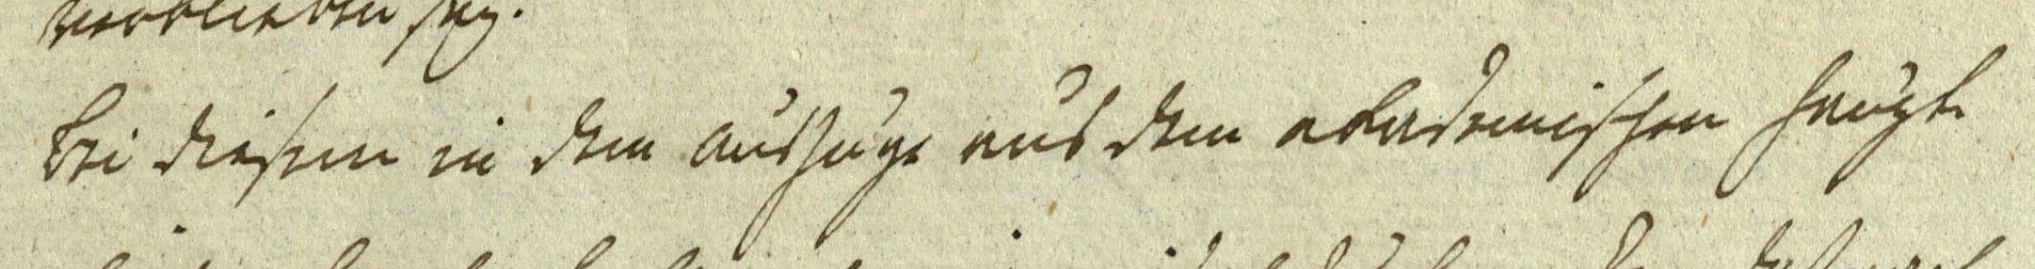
Bei diesem in dem Auszuge aus dem akademischen Haupt¬
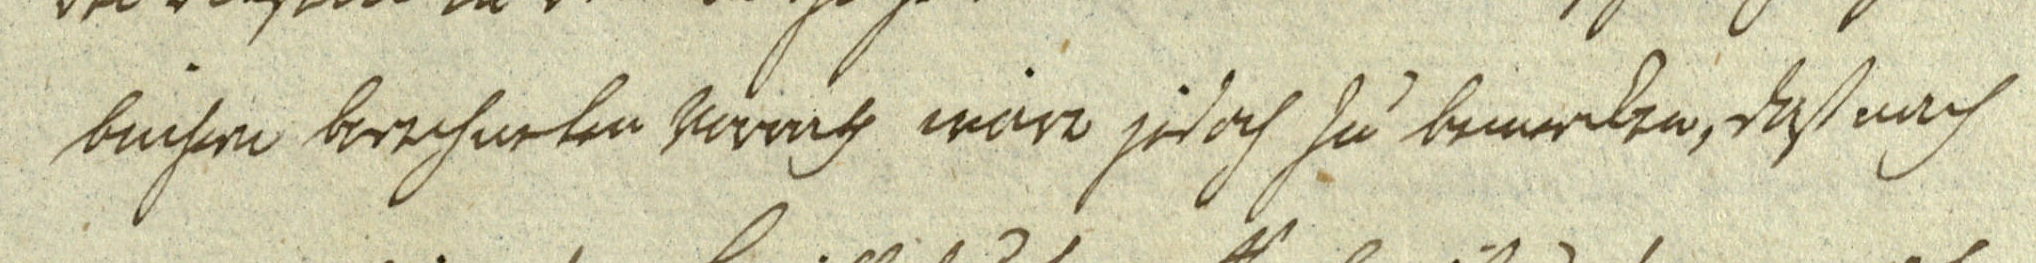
büchern berechneten Vorrath wäre jedoch zu bemercken, daß nach
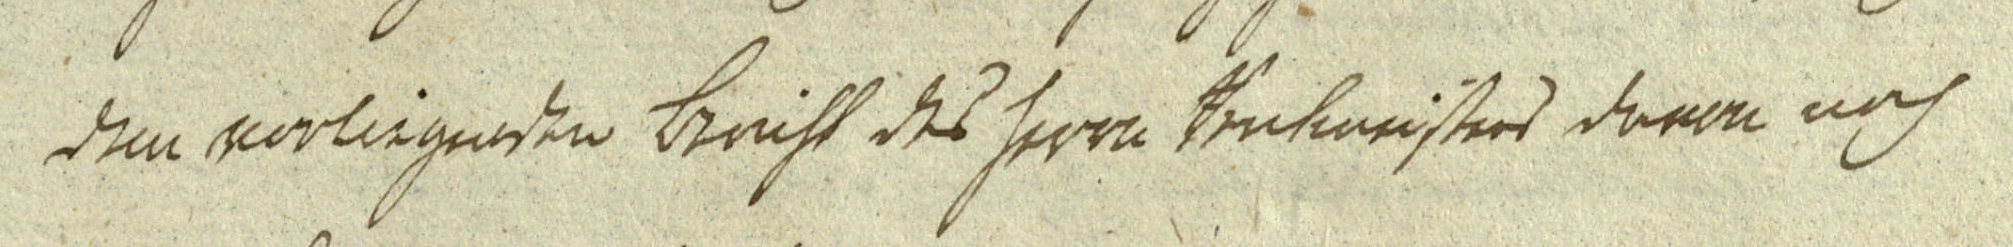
dem vorliegenden Bericht des Herrn Rentmeisters davon noch
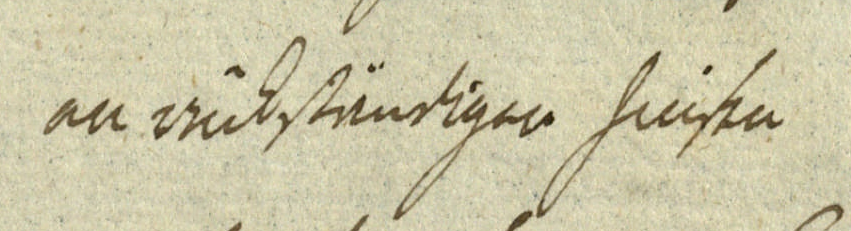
an rückständigen Zinsen
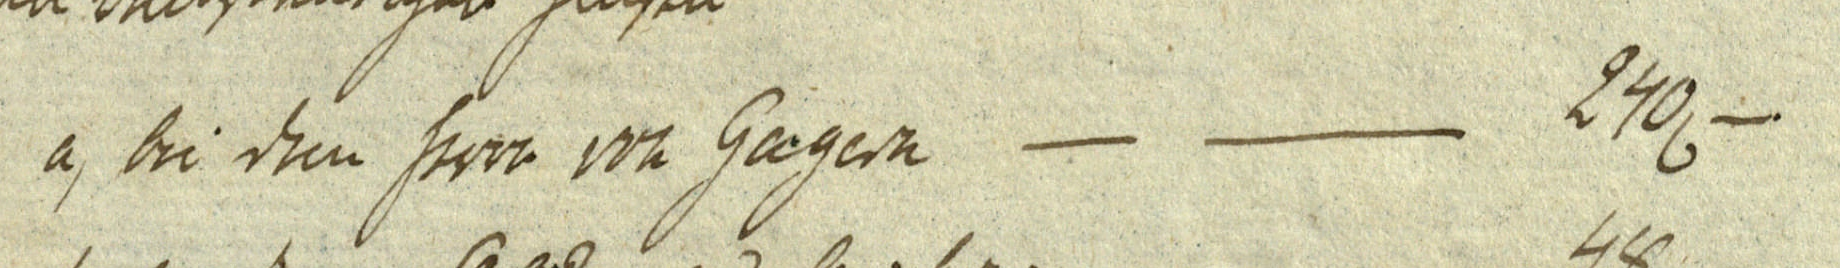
a, bei dem Herr von Gagern 240
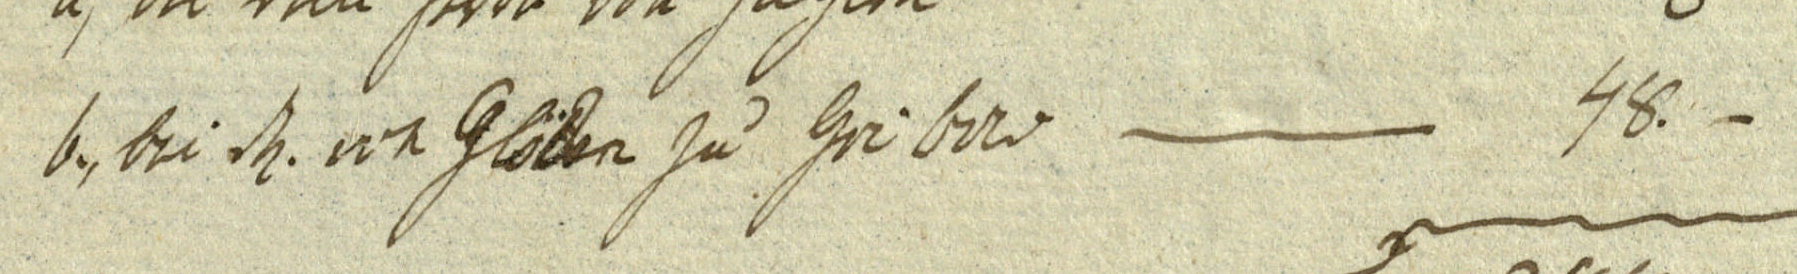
b., bei dh. von Glöden zu Gribow 48
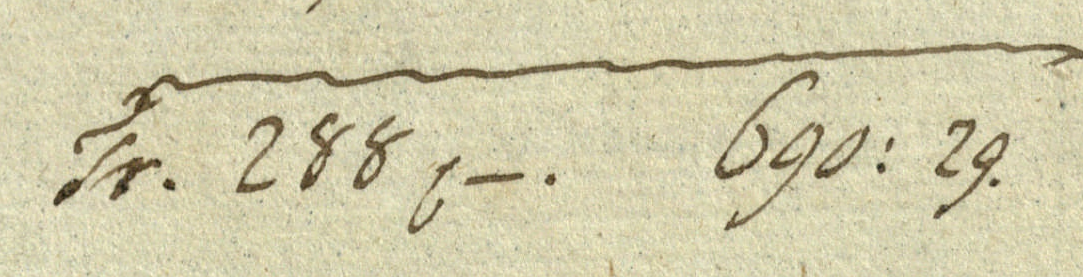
tr. 288 690: 29.
